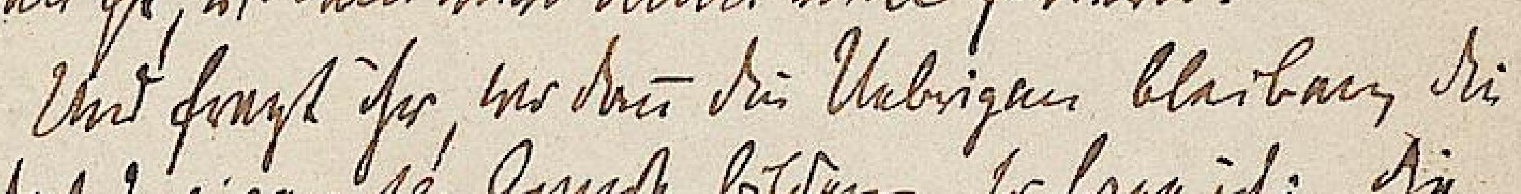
Und fragt ihr, wo dan die Uebrigen bleiben, die
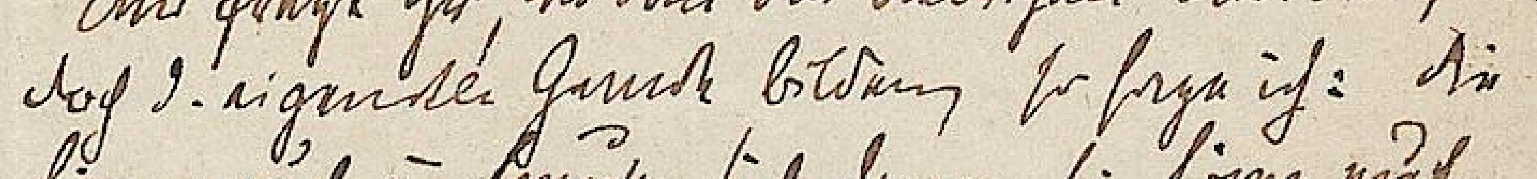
doch d. eigentli. Gemde bilden, so sage ich: die
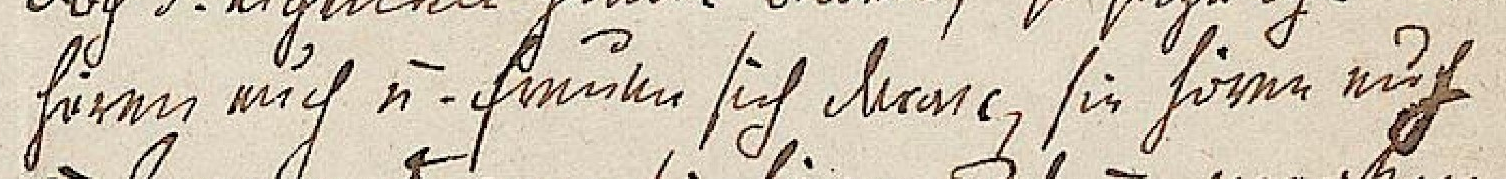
hören euch u. freuen sich daran, sie hören euch
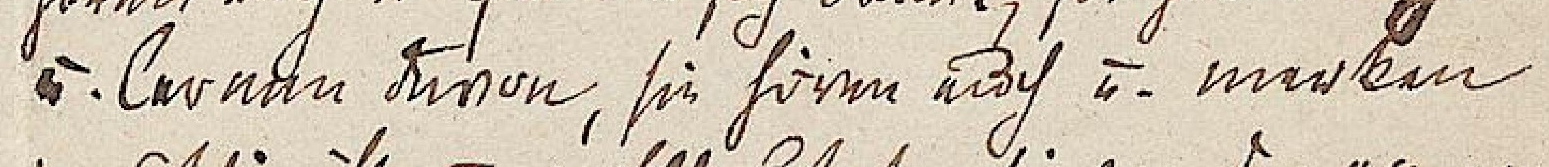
u. lernen davon, sie hören euch u. merken
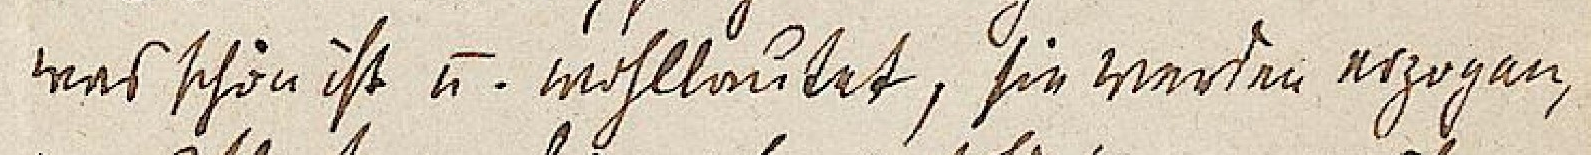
was schön ist u. wohllautet, sie werden erzogen,
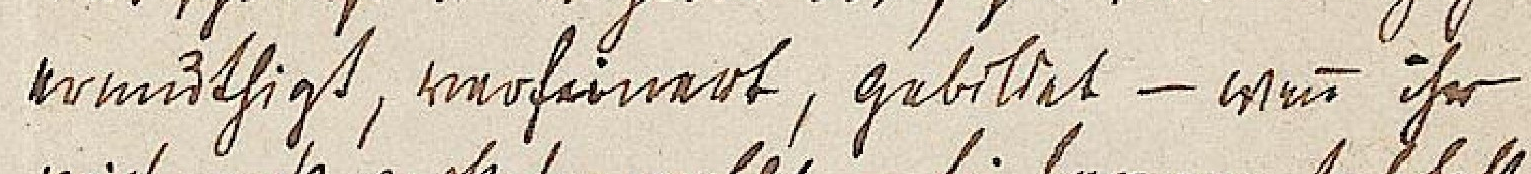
ermuthigt, verfeinert, gebildet _ wen ihr
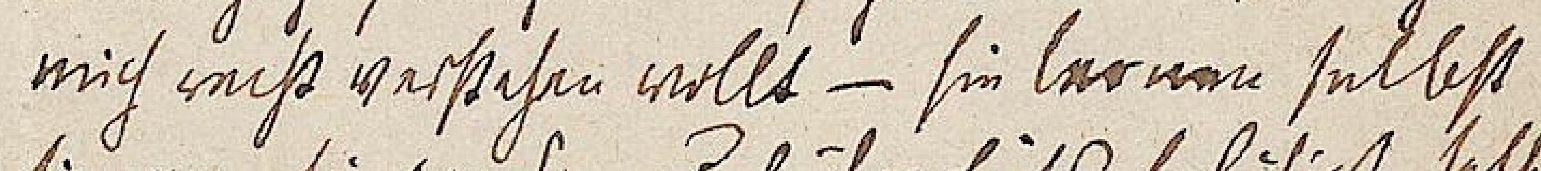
mich recht verstehen wollt _ sie lernen selbst
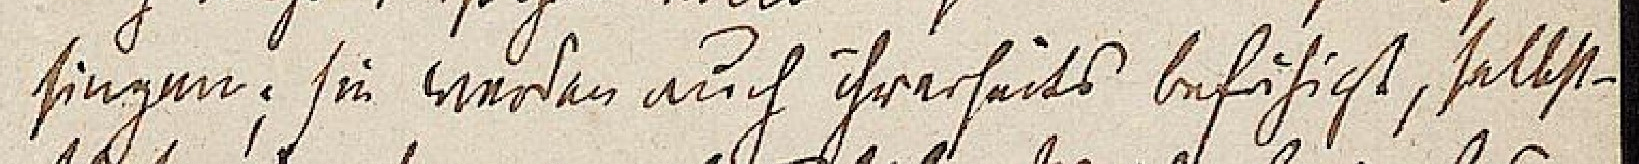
singen; sie werden auch ihrerseits befähigt, selbst
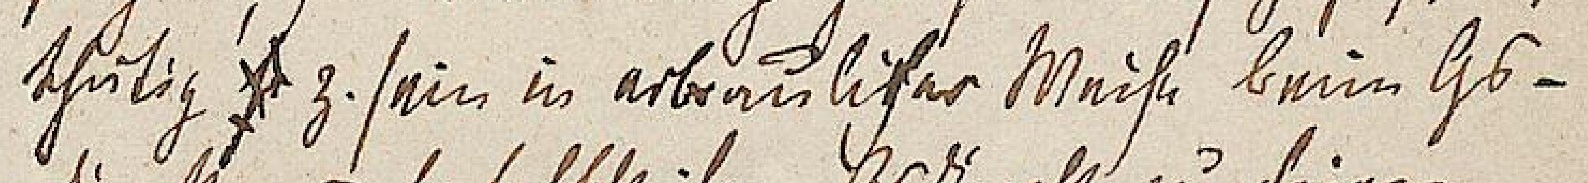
thätig fr z. sein in erbaulicher Weise beim Gs¬
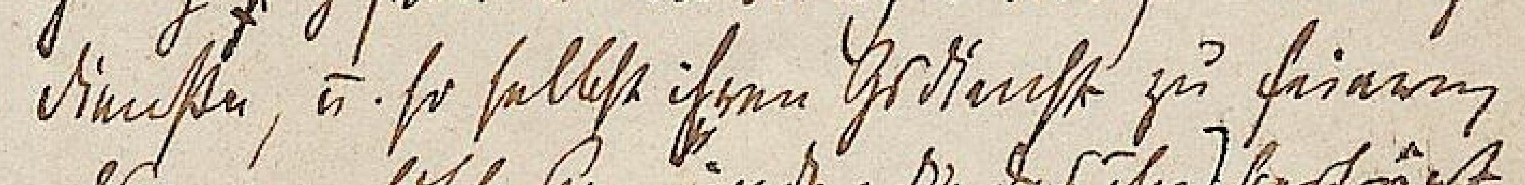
dienste, u. so selbst ihren Gsdienst zu feiern,
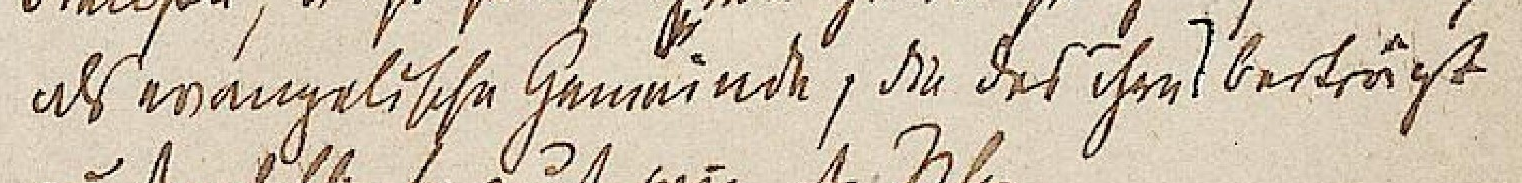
als evangelische Gemeinde, die des ihre beiträgt
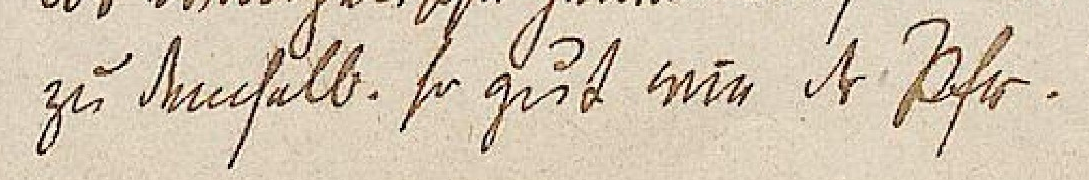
zu demselb. so gut wie der Pfr.
